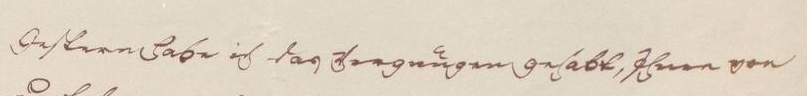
Gestern habe ich das Vergnügen gehabt, Ihnen von
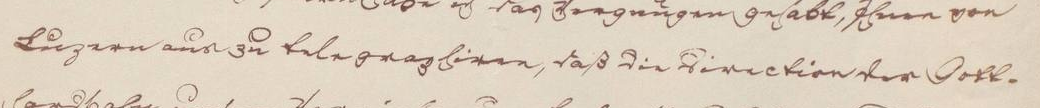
Luzern aus zu telegraphiren, daß die Direction der Gott-
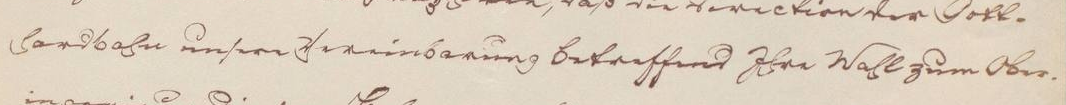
hardbahn unsere Vereinbarung betreffend Ihre Wahl zum Ober-
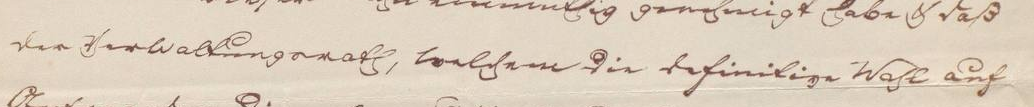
der Verwaltungsrath, welchem die definitive Wahl auf
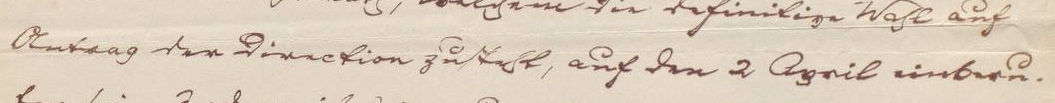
Antrag der Direction zusteht, auf den 2 April einberu-
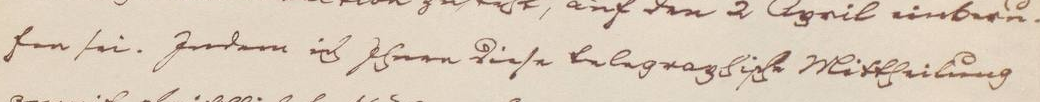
fen sei. Indem ich Ihnen diese telegraphische Mittheilung
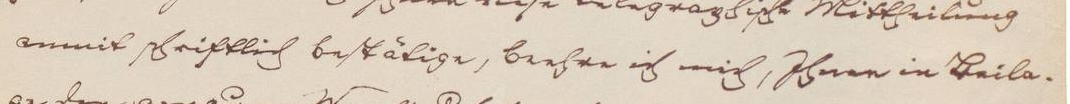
anmit schriftlich bestätige, beehre ich mich, Ihnen in Beila-
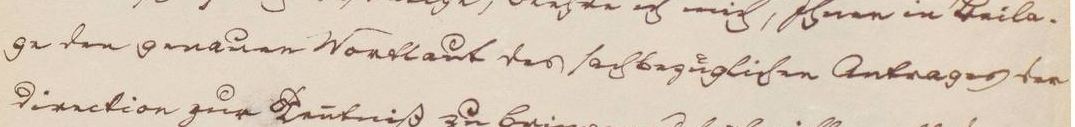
ge den genauen Wortlaut des sachbezüglichen Antrages der
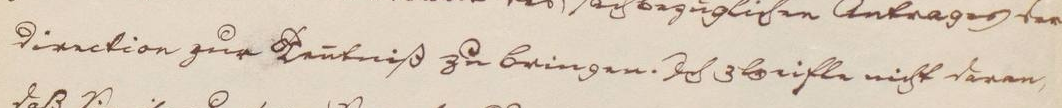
Direction zur Kenntniß zu bringen. Ich zweifle nicht daran,
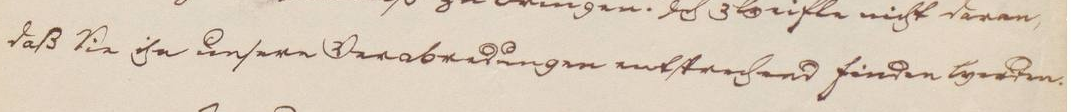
daß Sie ihn unsern Verabredungen entsprechend finden werden.
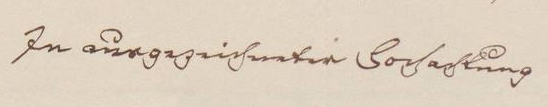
In ausgezeichneter Hochachtung
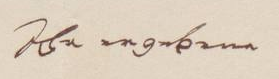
Ihr ergebene
